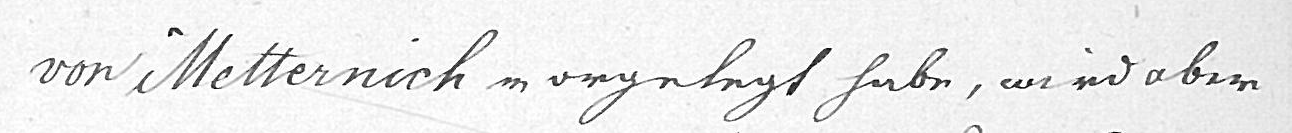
von Metternich vorgelegt habe, wird aber
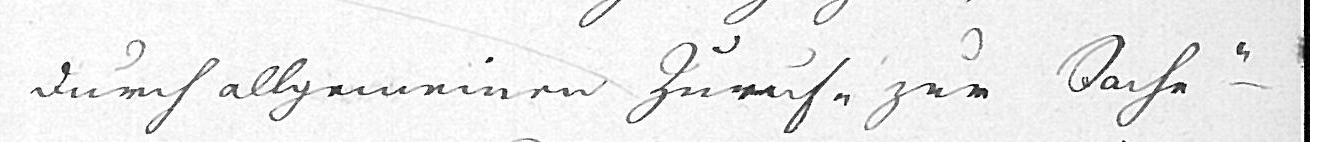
durch allgemeinen Zuruf "zur Sache" -
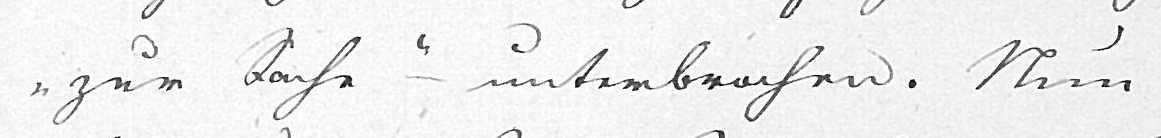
"zur Sache". - unterbrochen. Nun
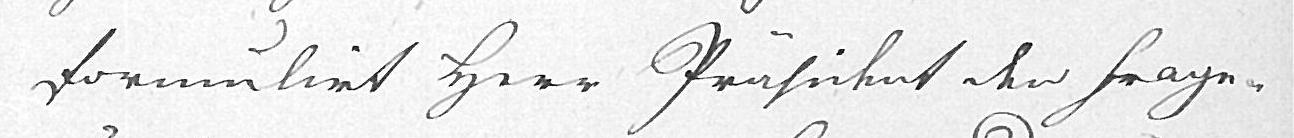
formulirt Herr Präsident den Frage-
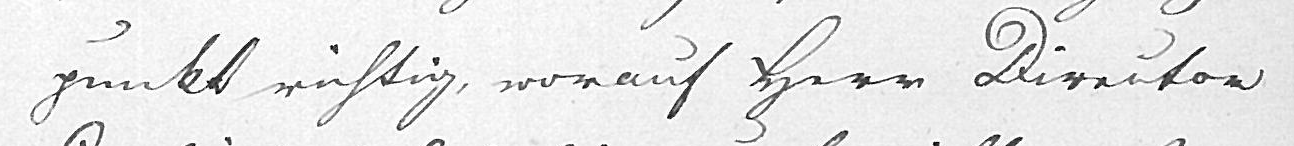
punkt richtig, worauf Herr Director
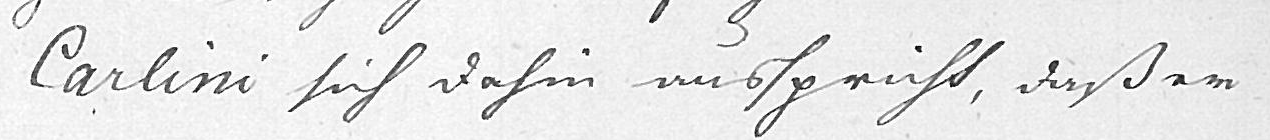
Carlini sich dahin ausspricht, daß er
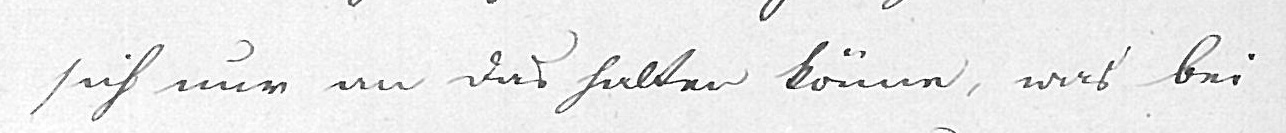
sich nur an das halten könne, was bei
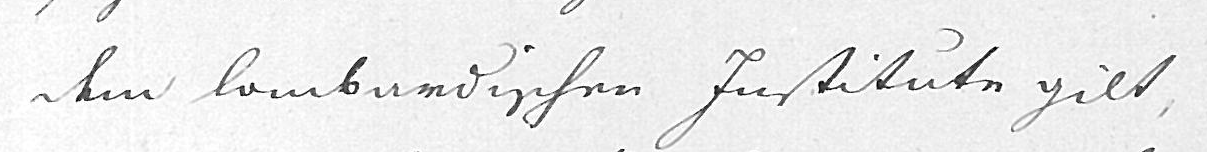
dem lombardischen Institute gilt,
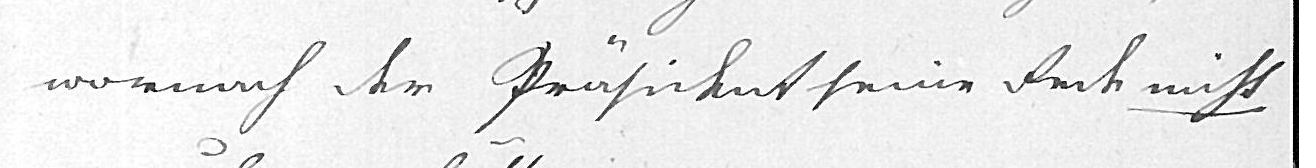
wornach der Präsident seine Rede nicht
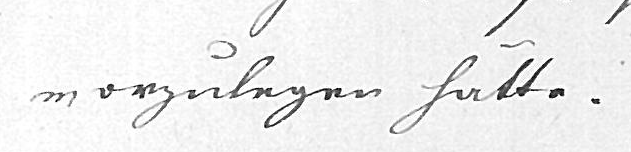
vorzulegen hätte.
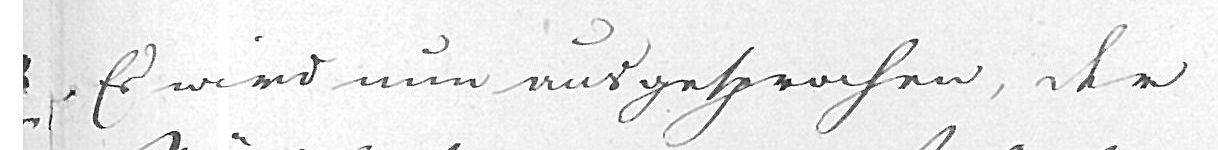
Es wird nun ausgesprochen, der
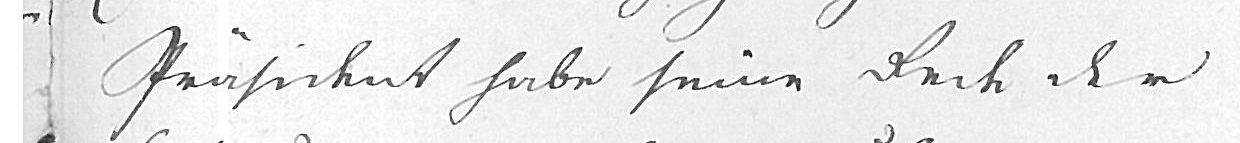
Präsident habe seine Rede der
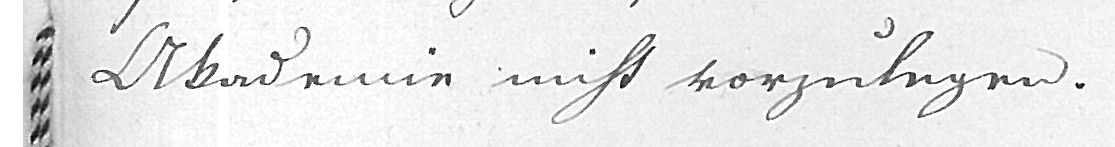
Akademie nicht vorzulegen.
